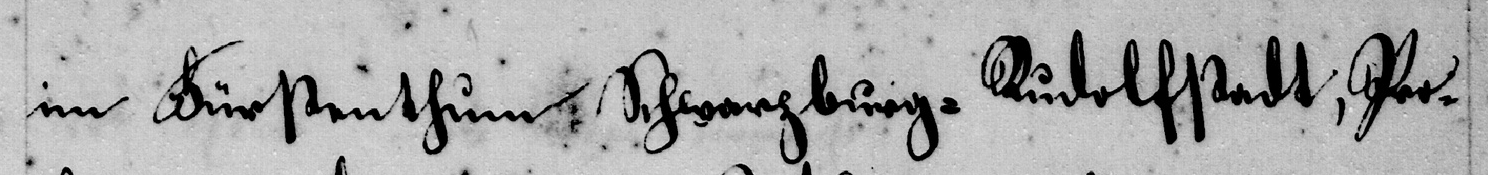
im Fürstenthum Schwarzburg-Rudolfstadt, Pro¬
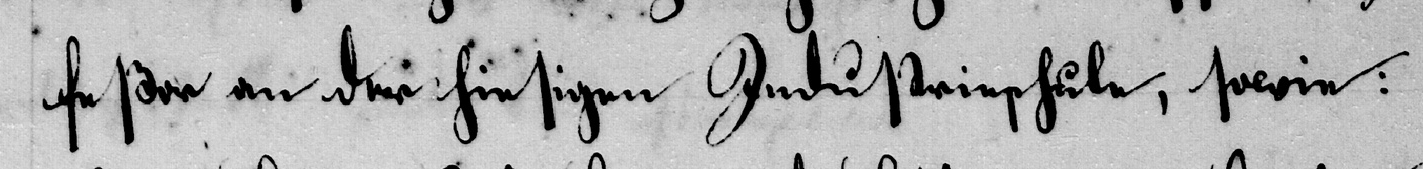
feßor an der hiesigen Industrieschule, sowie:
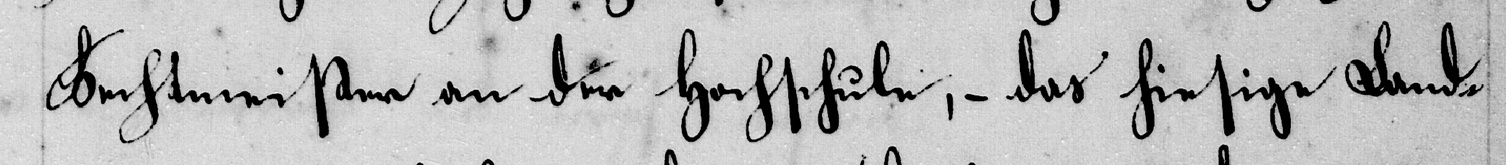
Fechtmeister an der Hochschule, – das hiesige Land¬
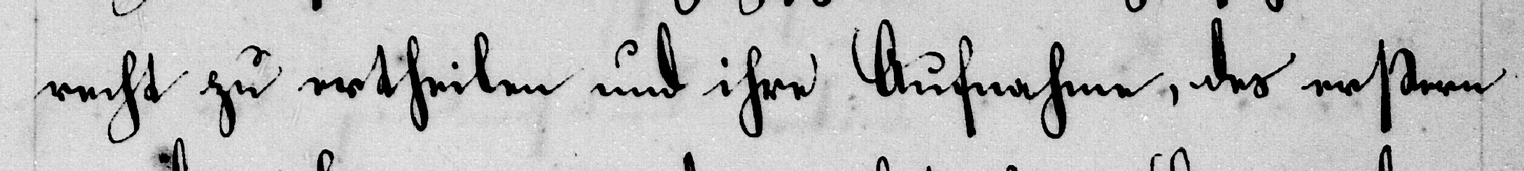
recht zu ertheilen und ihre Aufnahme, des ersten
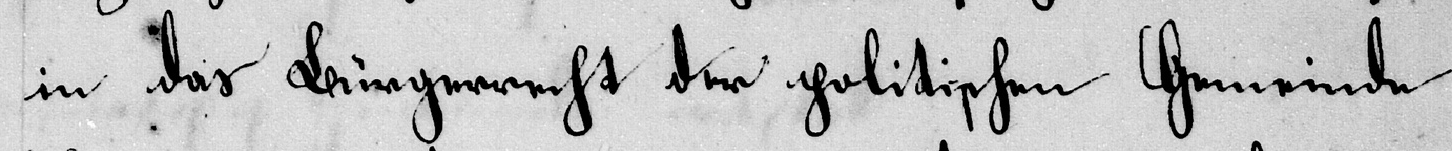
in das Bürgerrecht der politischen Gemeinde
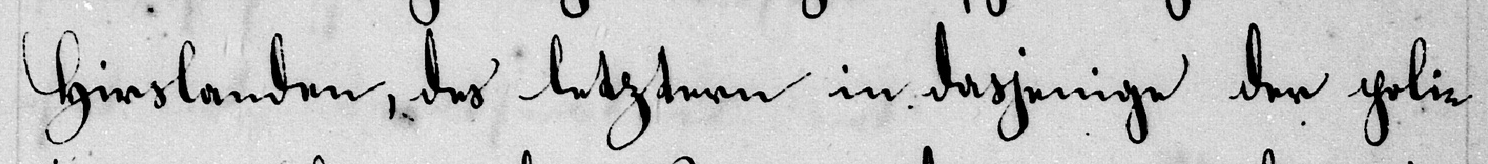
Hirslanden, des letztern in dasjenige der poli¬
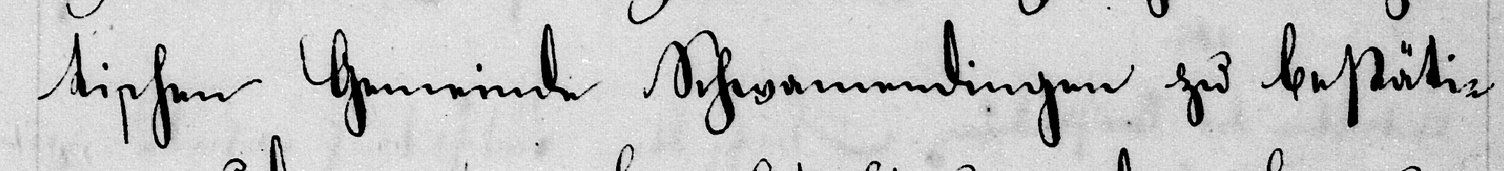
tischen Gemeinde Schwamendingen zu bestäti¬
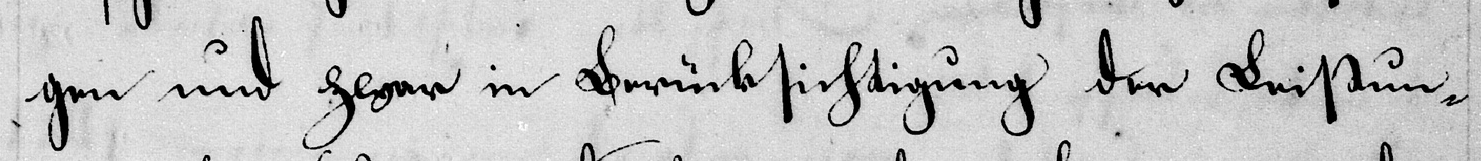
gen und zwar in Berücksichtigung der Leistun¬
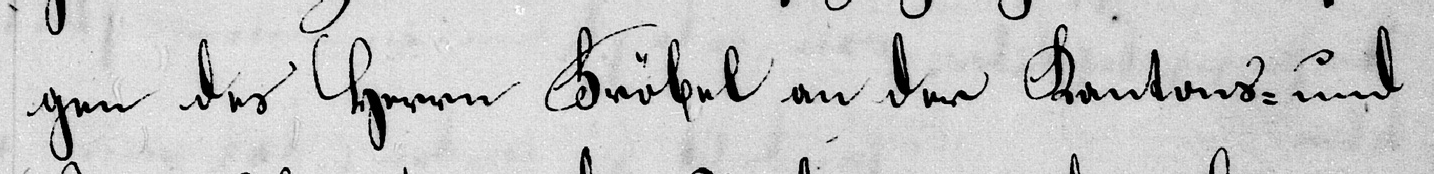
gen des Herrn Fröbel an der Kantons- und
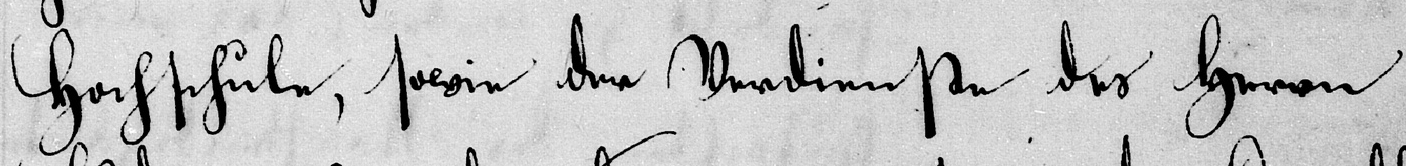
Hochschule, sowie der Verdienste des Herrn
